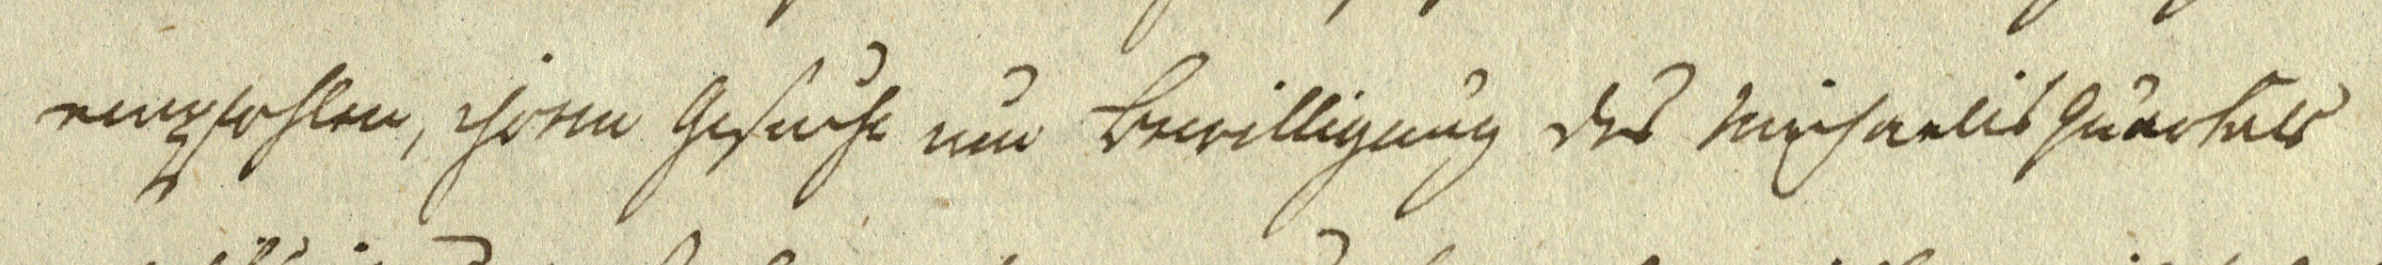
empfohlen, ihrem Gesuch um Bewilligung des Michaelis Quartals
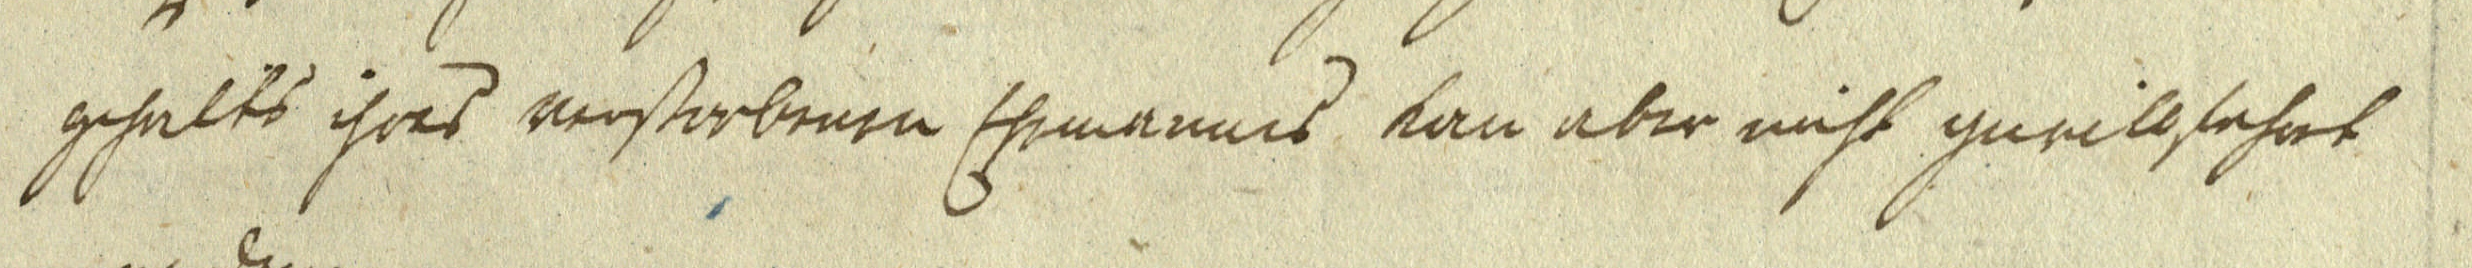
gehalts ihres verstorbenen Ehemannes kan aber nicht gewillfahret
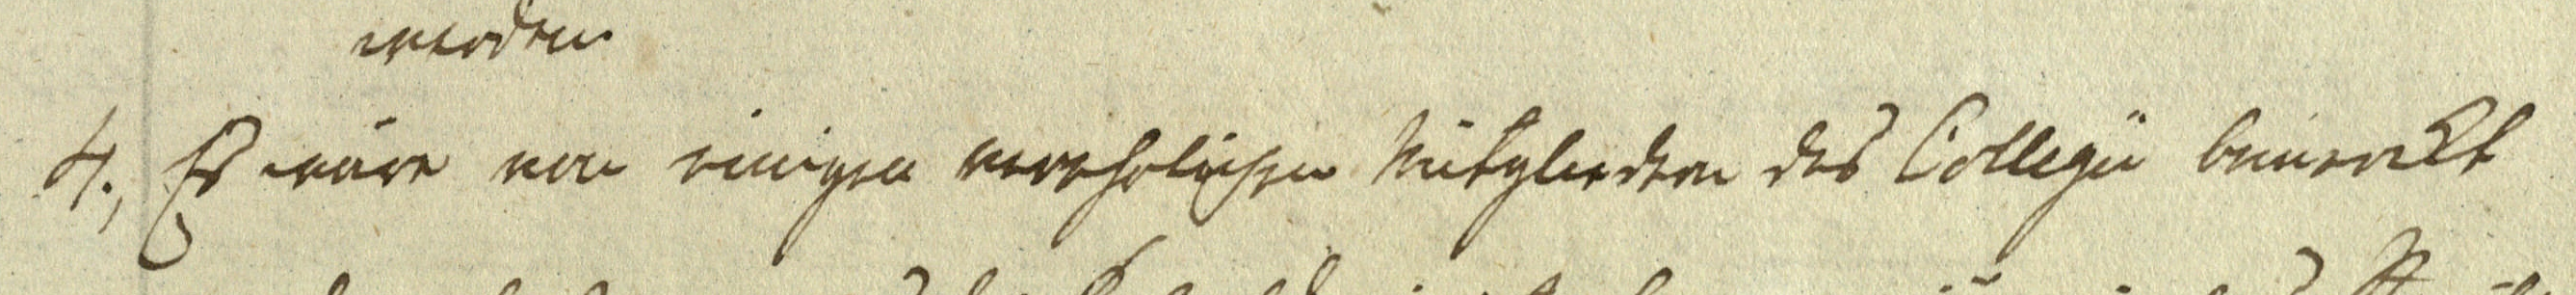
4., Er wäre von einigen verehrlichen Mitgliedern des Collegii bemerkt
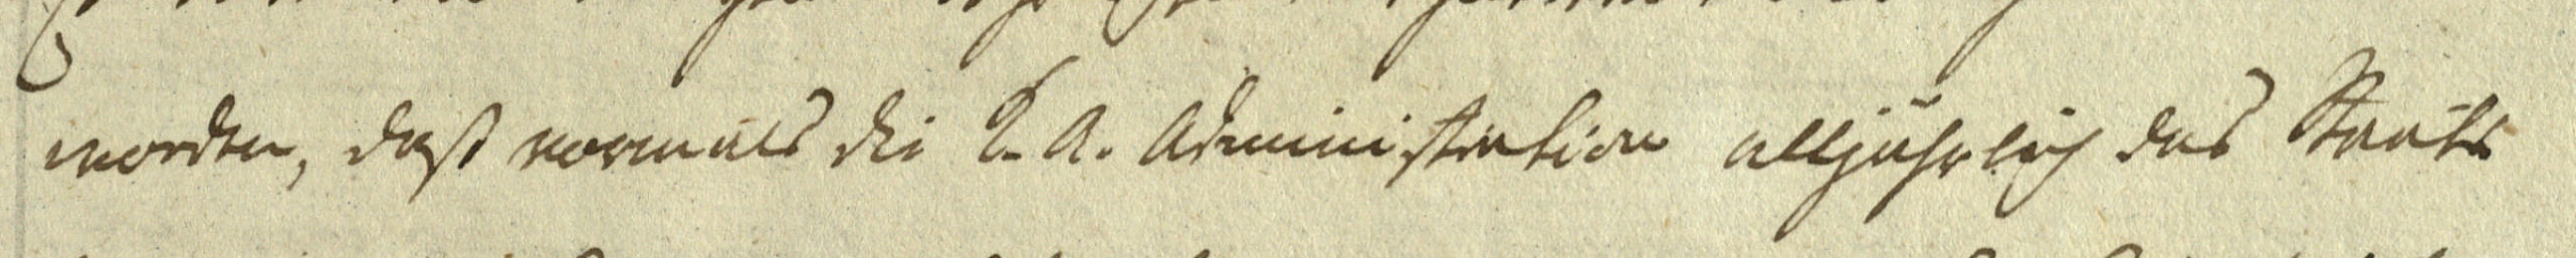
worden, daß vormals die K. A. Administration alljährlich das Staats
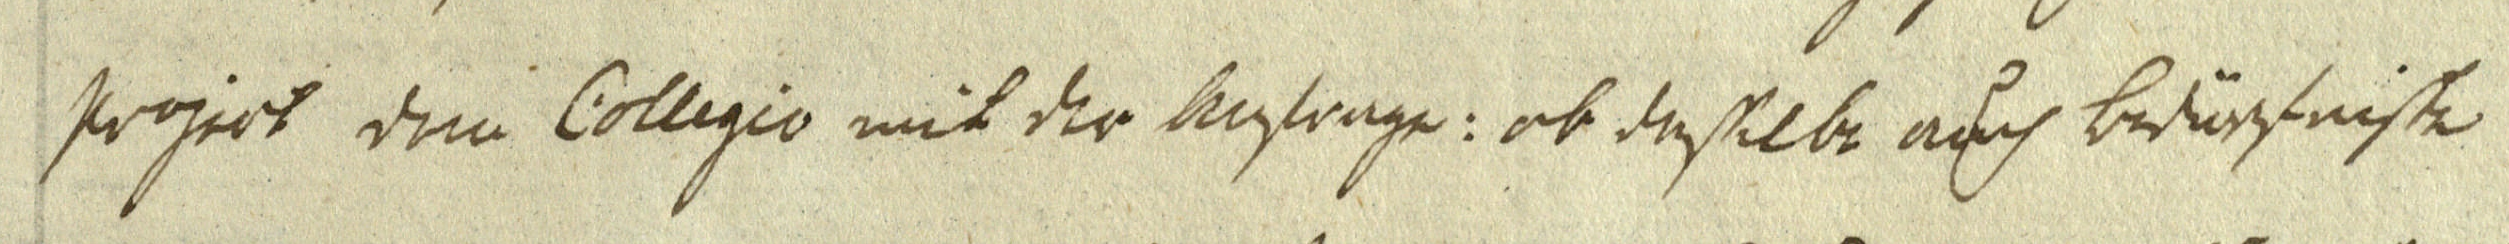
Project dem Collegio mit der Anfrage: ob dasselbe auch Bedürfnisse
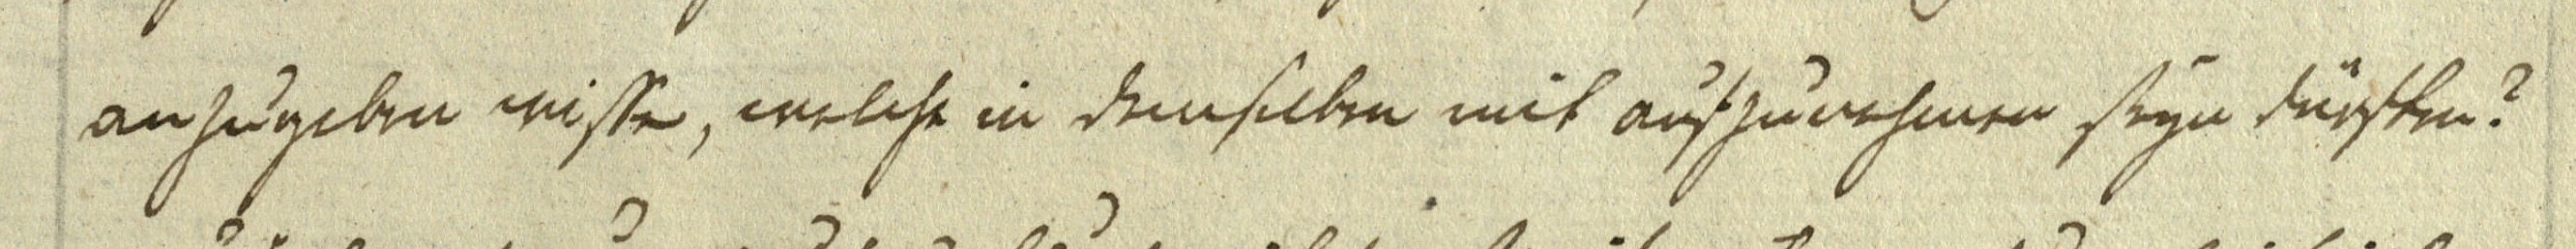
anzugeben wisse, welche in demselben mit aufzunehmen seÿn dürften?
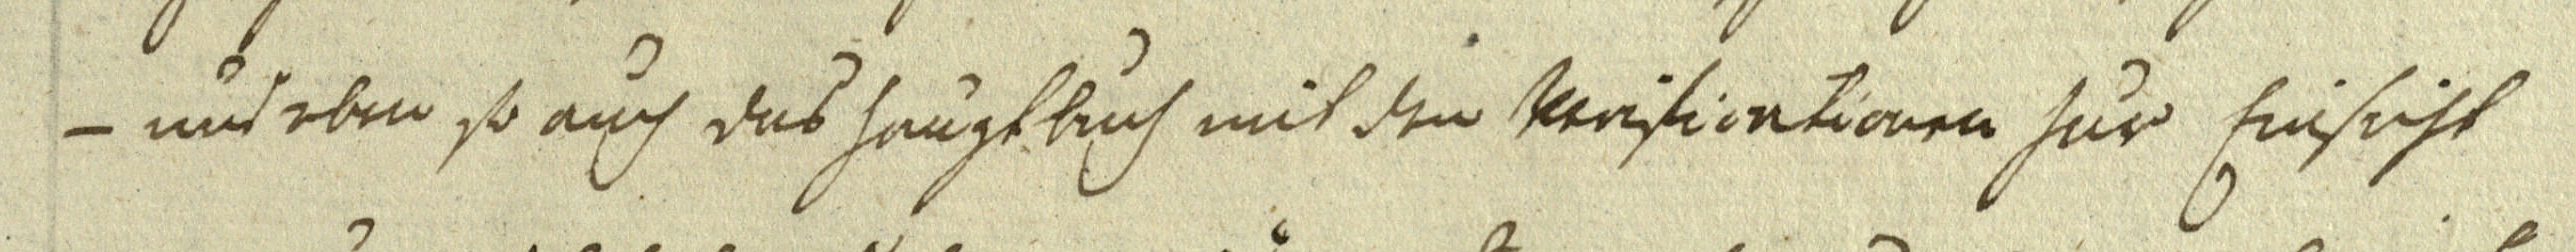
- und eben so auch das Hauptbuch mit den Verificationen zur Einsicht
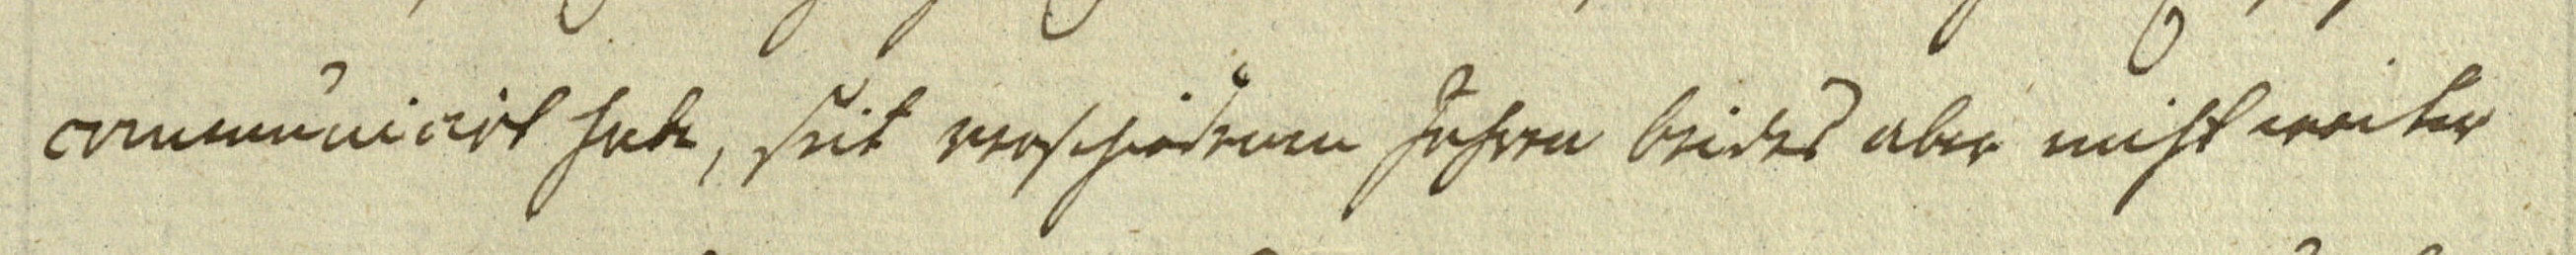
communicirt habe, seit verschiedenen Jahren beides aber nicht weiter
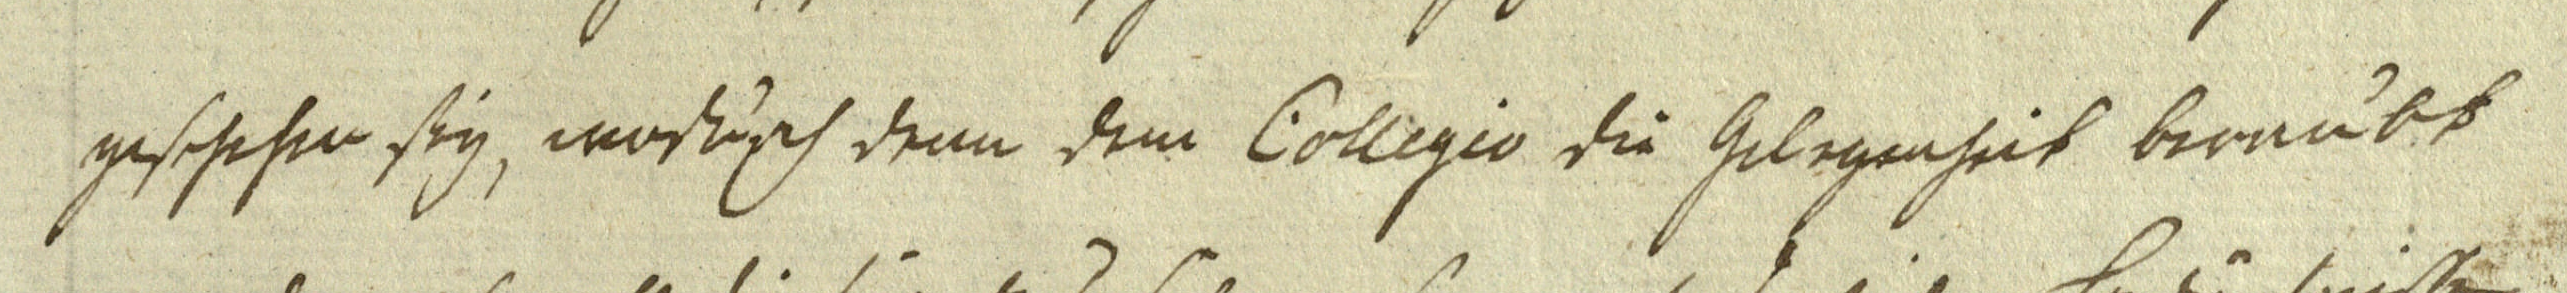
geschehen seÿ, wodurch denn dem Collegio die Gelegenheit beraubt
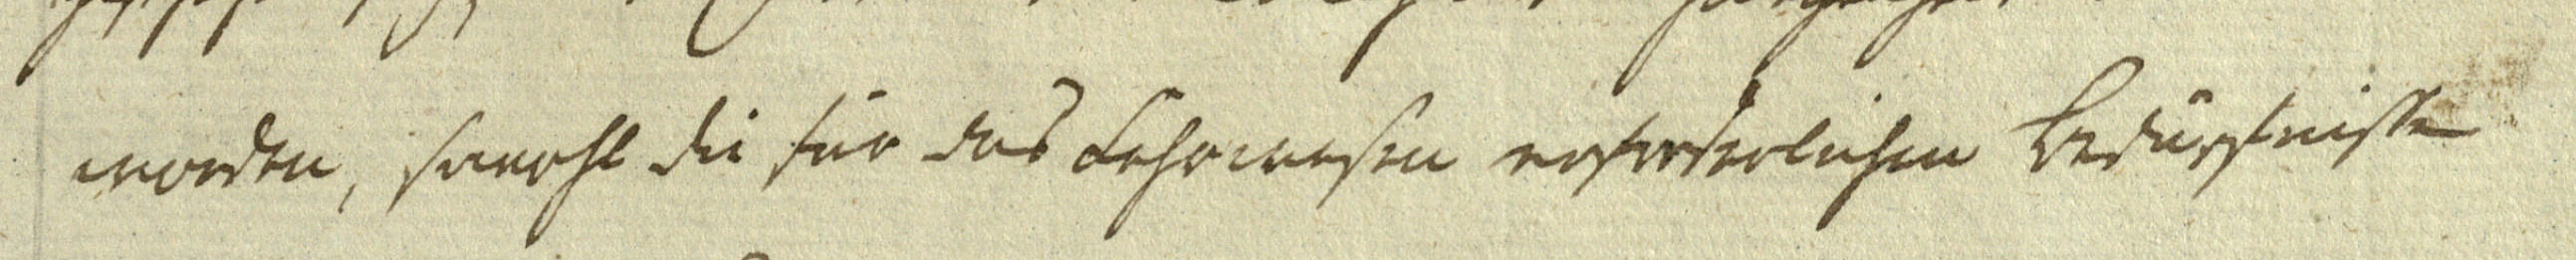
worden, sowohl die für das Lehrwesen erforderlichen Bedürfnisse
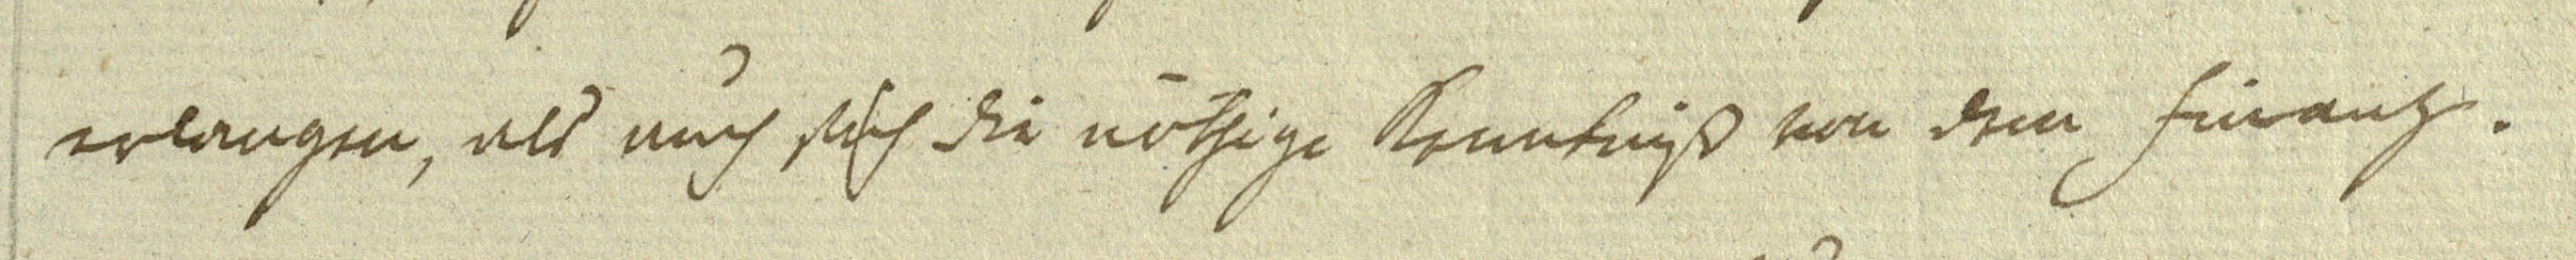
erlangen, als auch sich die nöthige Kenntniß von dem Finanz¬
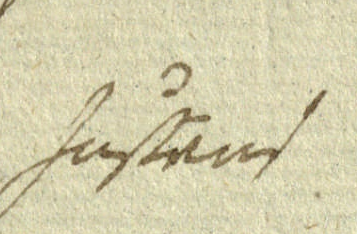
zustand
